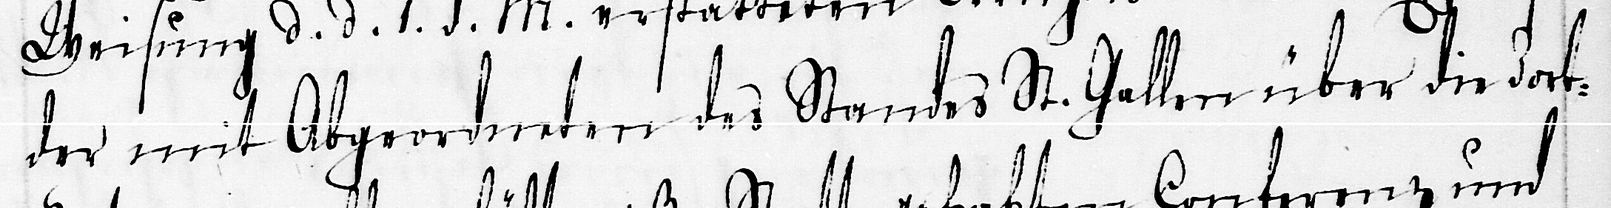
der mit Abgeordneten des Standes St. Gallen über die dort¬
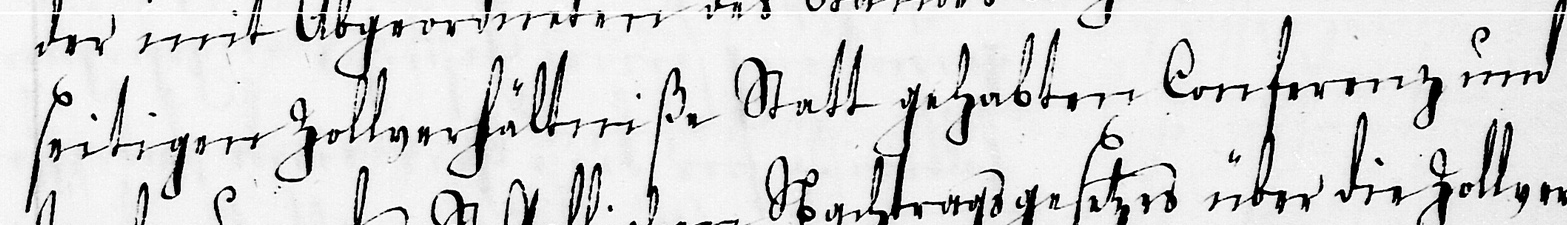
seitigen Zollverhältniße Statt gehabten Conferenz und
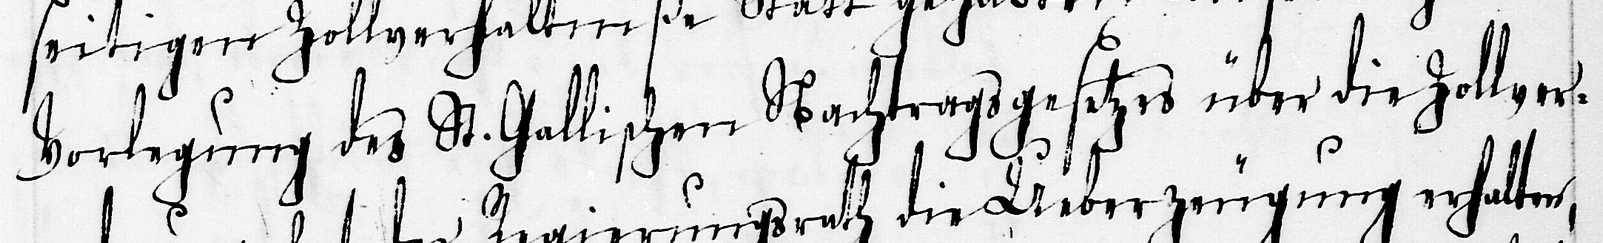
Vorlegung des St. Gallischen Nachtragsgesetzes über die Zollver¬
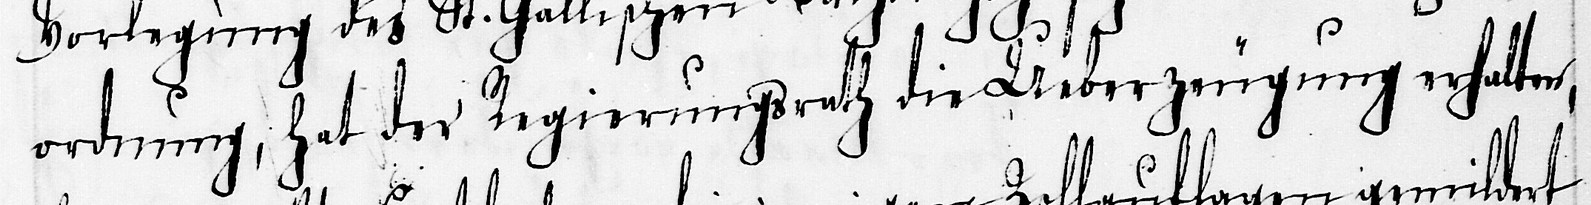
ordnung, hat der Regierungsrath die Ueberzeugung erhalten,
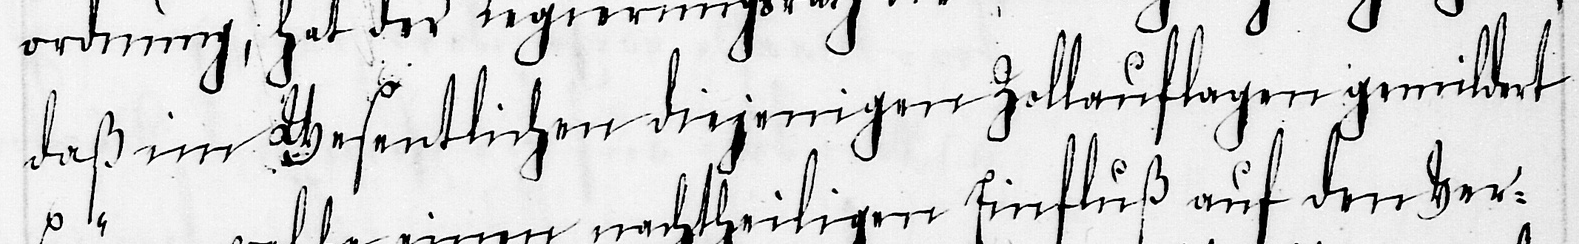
daß im Wesentlichen diejenigen Zollauflagen gemildert
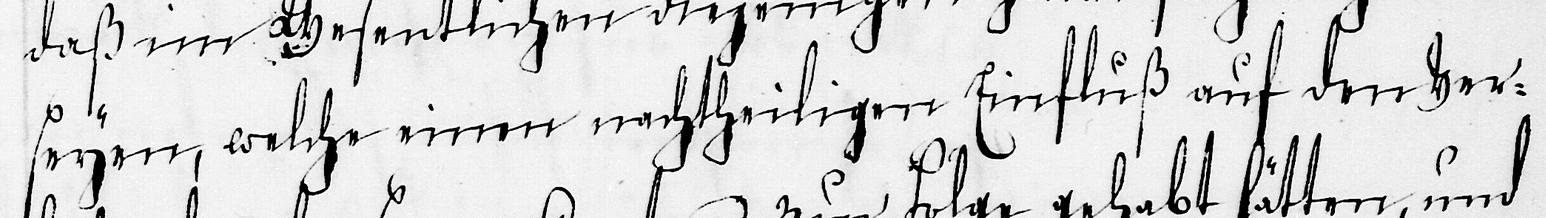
seyen, welche einen nachtheiligen Einfluß auf den Ver¬
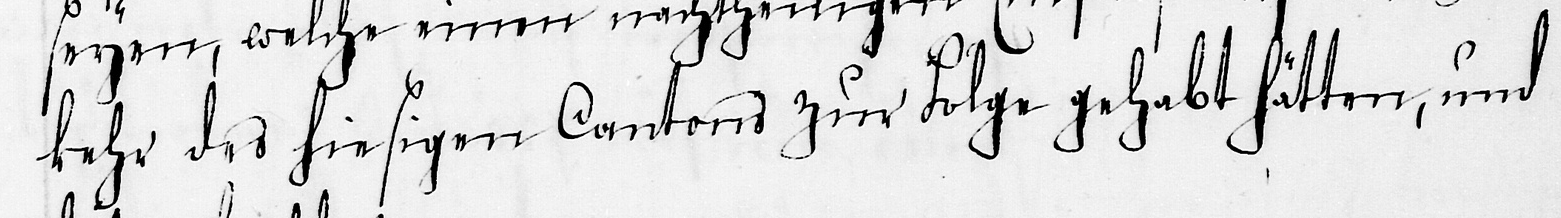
kehr des hiesigen Cantons zur Folge gehabt hätten, und
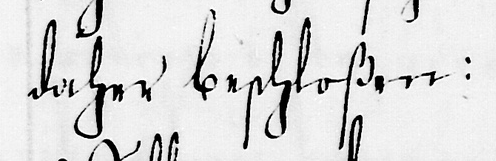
daher beschloßen:
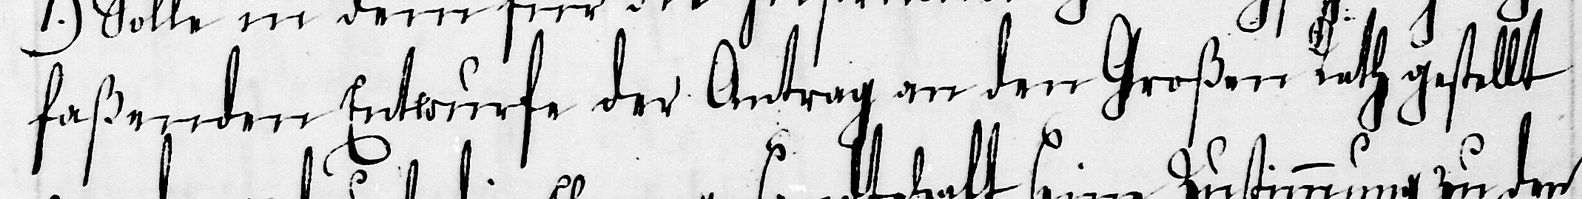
faßenden Entwurfe der Antrag an den Großen Rath gestellt
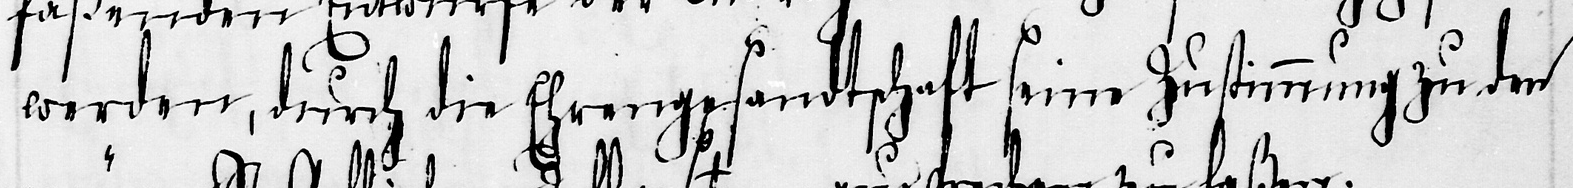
werden, durch die Ehrengesandtschaft seine Zustimmung zu den
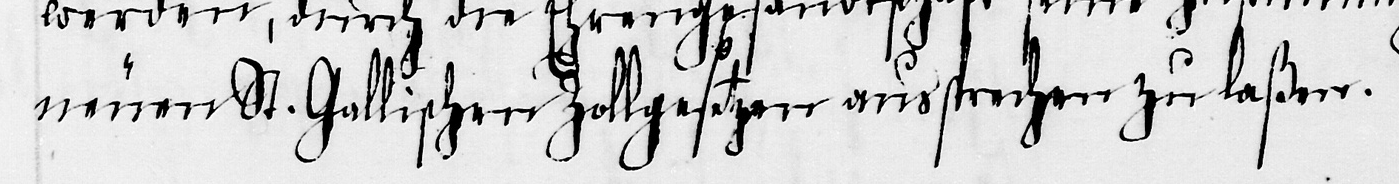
neuen St. Gallischen Zollgesetzen aussprechen zu laßen.
